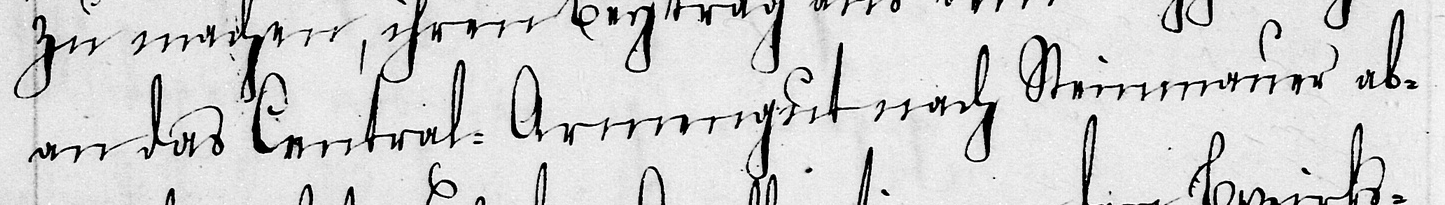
an das Central-Armengut nach Steinmauer ab¬
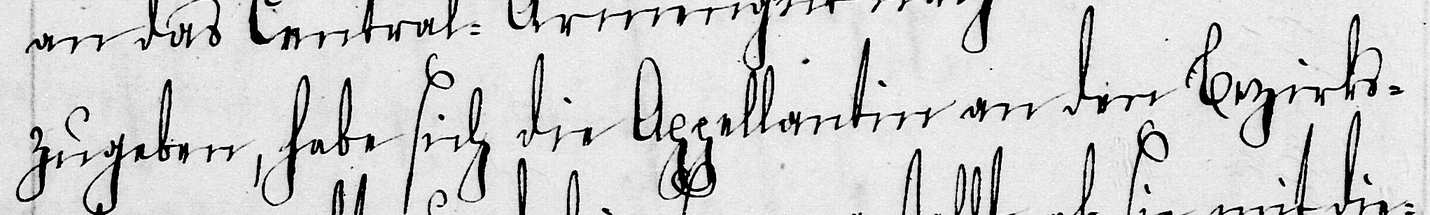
zugeben, habe sich die Appellantin an den Bezirksr¬
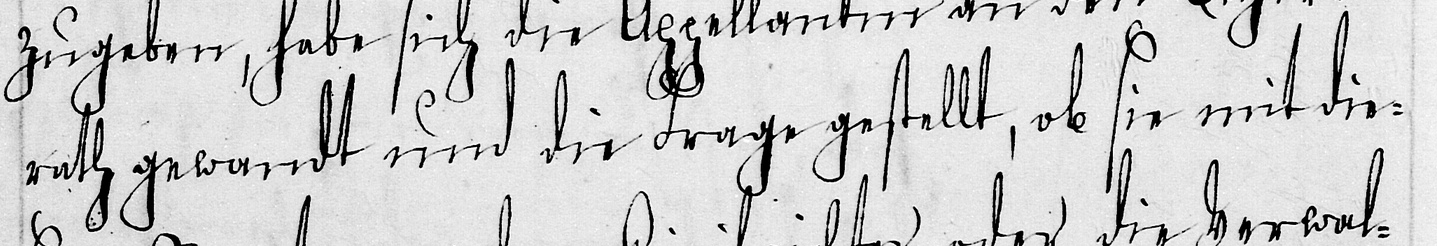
ath gewandt und die Frage gestellt, ob sie mit
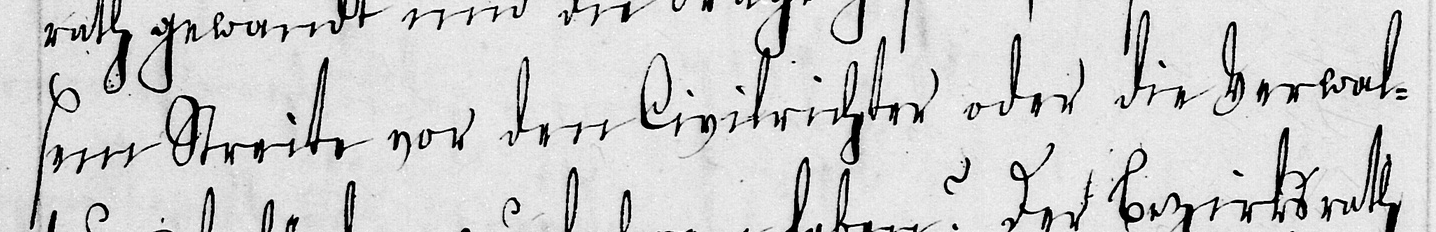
sem Streite vor den Civilrichter oder die Verwal¬
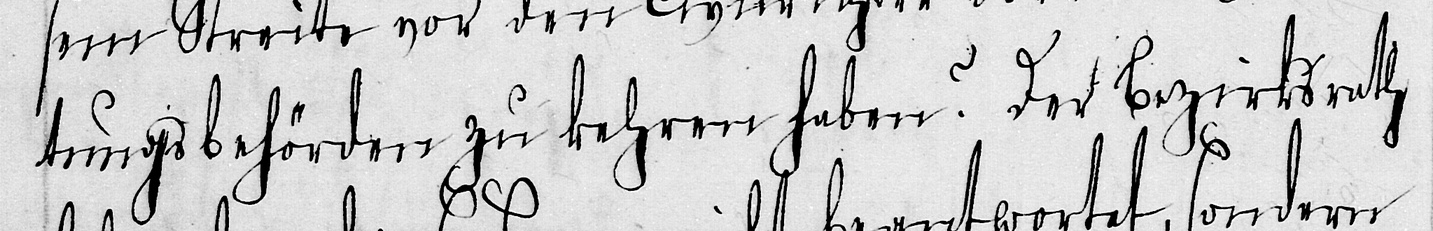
tungsbehörden zu kehren haben? Der Bezirksrath
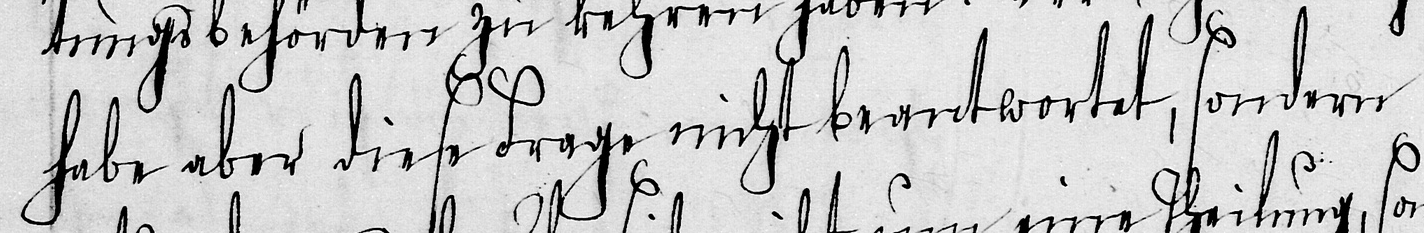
habe aber die Frage nicht beantwortet, sondern
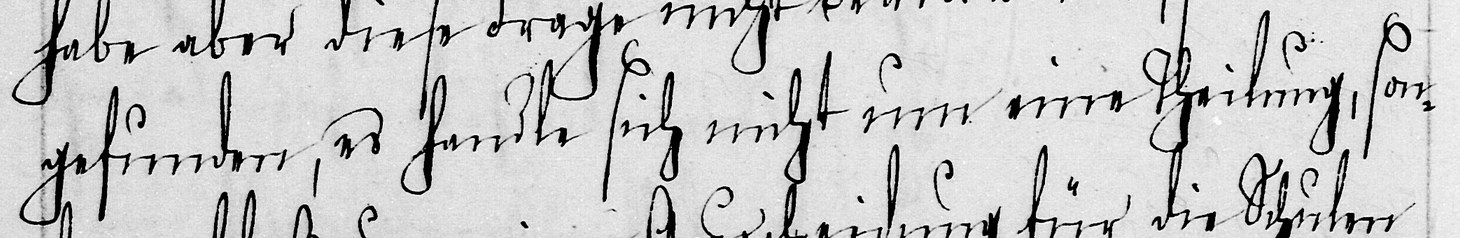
gefunden, es handle sich nicht um eine Theilung, so¬
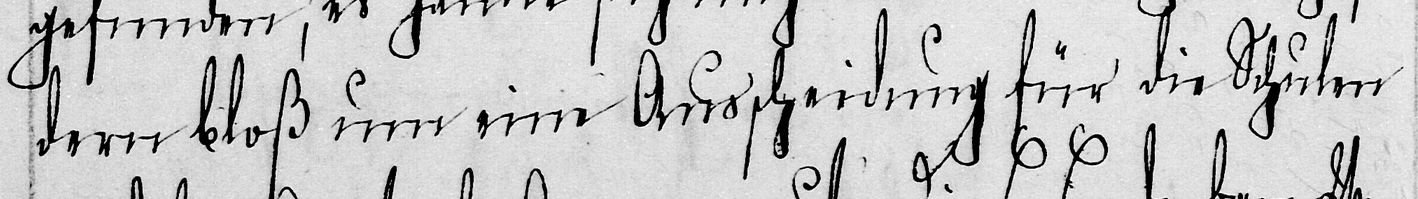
ndern bloß um eine Ausscheidung für die Schulen
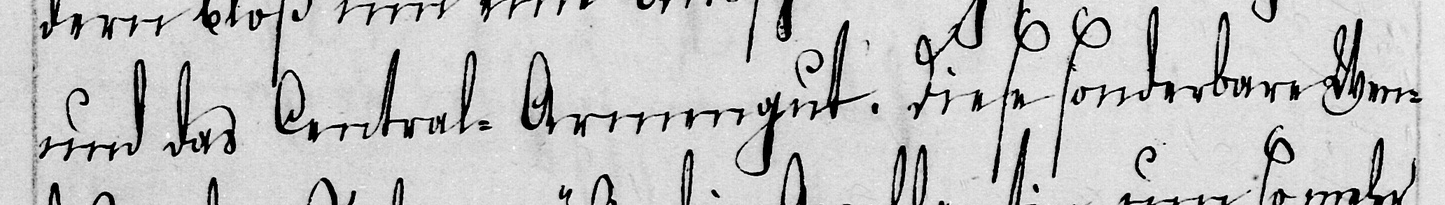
und das Central-Armengut. Diese sonderbare Wen¬
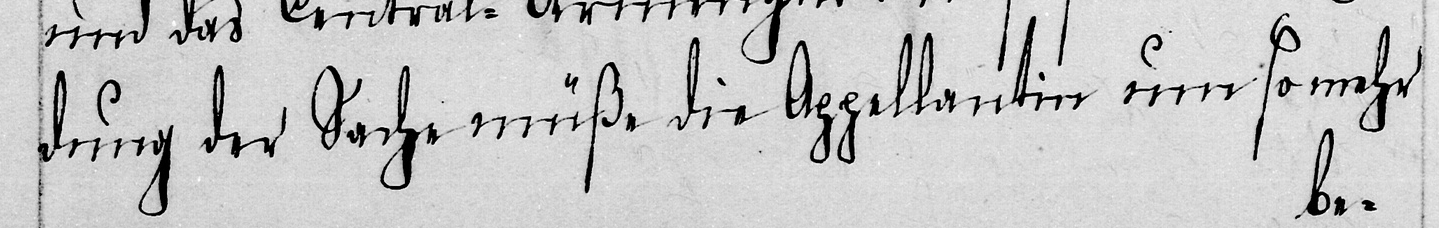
dung der Sache müße die Appellantin um so mehr
